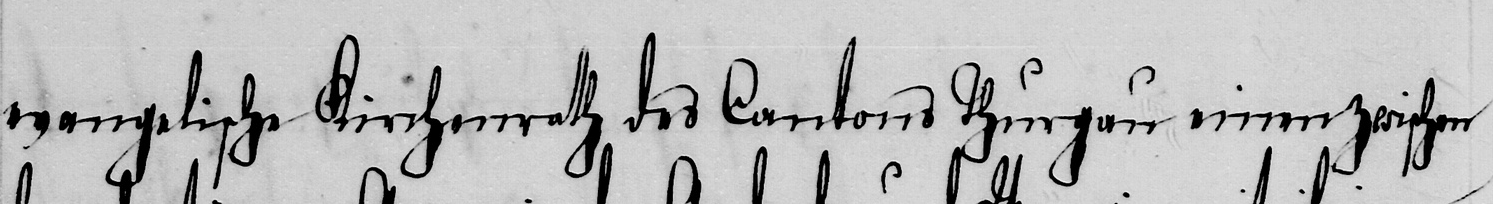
evangelische Kirchenrath des Cantons Thurgau einen zwischen
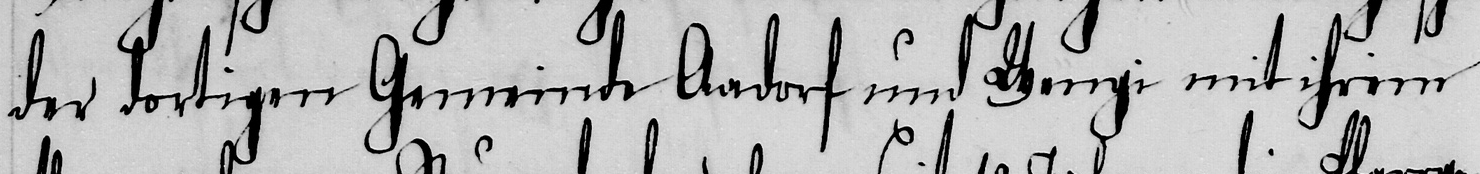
der dortigen Gemeinde Aadorf und Wengi mit ihrem
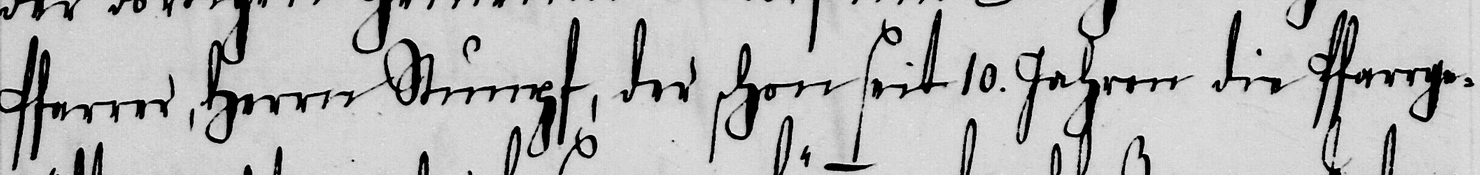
Pfarrer, Herrn Stumpf, der schon seit 10. Jahren die Pfarrge¬
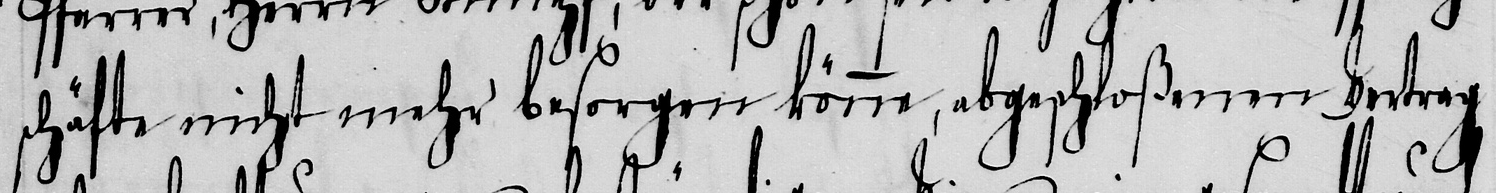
schäfte nicht mehr besorgen könne, abgeschloßenen Vertrag
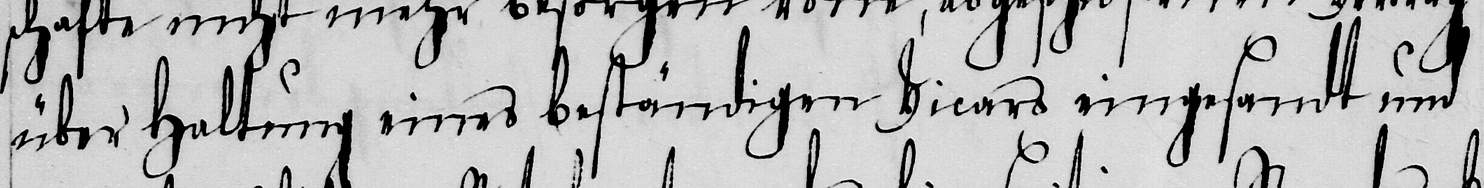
über Haltung eines beständigen Vicars eingesandt und
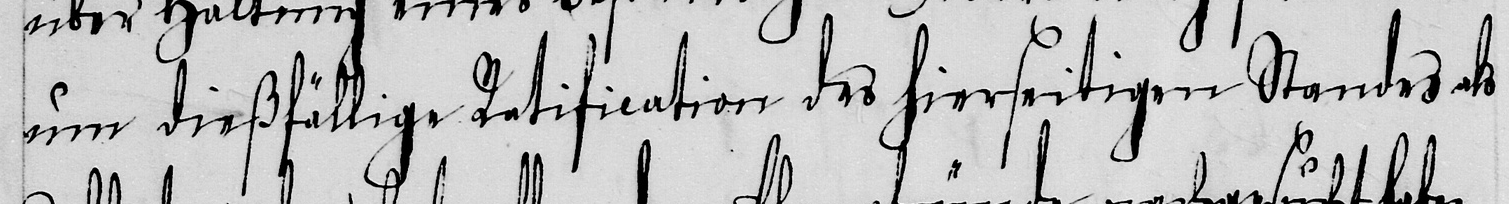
um dießfällige Ratification des hierseitigen Standes als
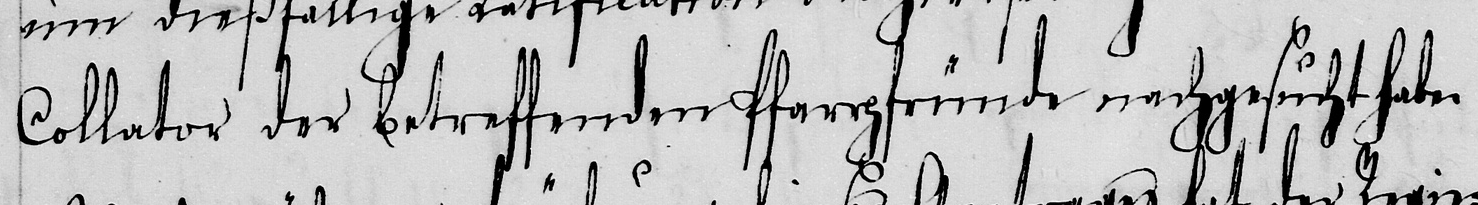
Collator der betreffenden Pfarrpfründe nachgesucht hab¬
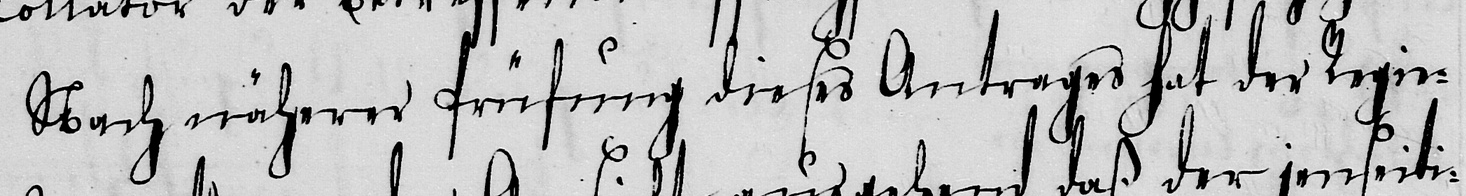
Nach näherer Prüfung dieses Antrages hat der Regie¬
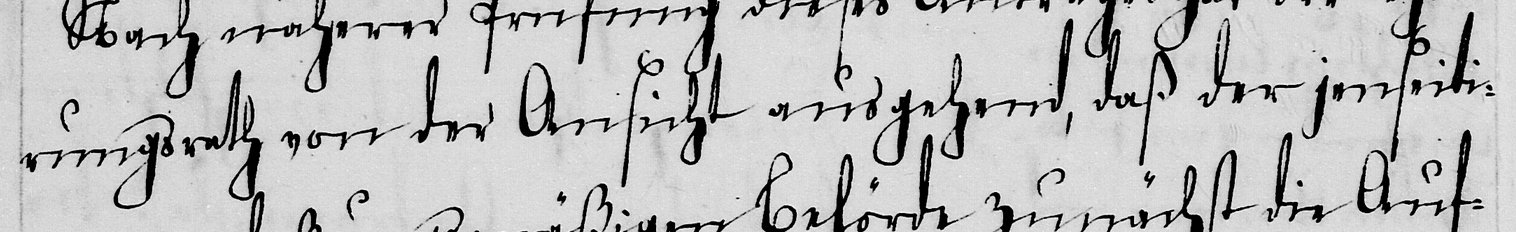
rungsrath von der Ansicht ausgehend, daß der jenseiti¬
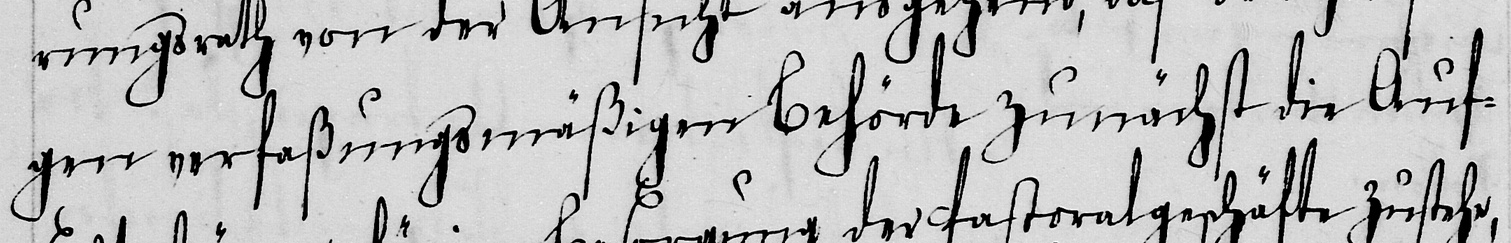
gen verfaßungsmäßigen Behörde zunächst die Auf¬
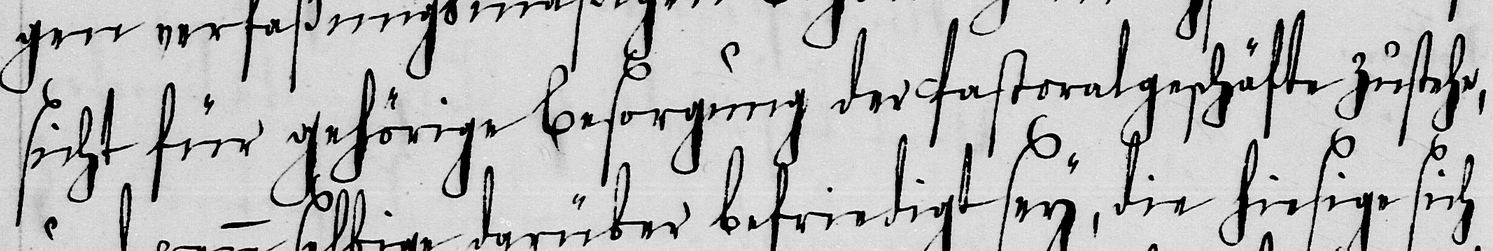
sicht für gehörige Besorgung der Pastoralgeschäfte zusteh¬
